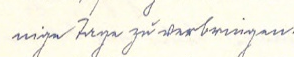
nige Tage zu verbringen.
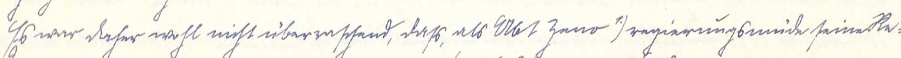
Es war daher wohl nicht überraschend, dass, als Abte Zeno1.) regierungsmüde seine Re-
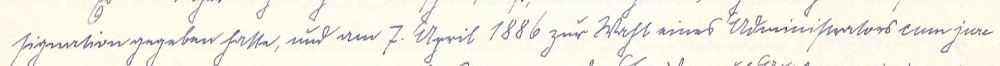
signation gegeben hatte, und am 7. April 1886 zur Wahl eines Administrators cum jure
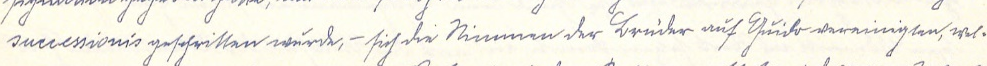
successionis geschritten wurde, - sich die Stimmen der Brüder auf Guido vereinigten, wel-
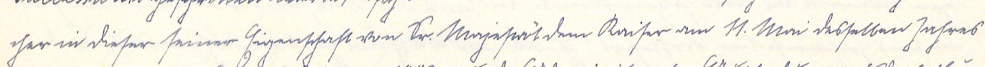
cher in dieser seiner Eigenschaft von Sr. Majestät dem Kaiser am 11. Mai desselben Jahres
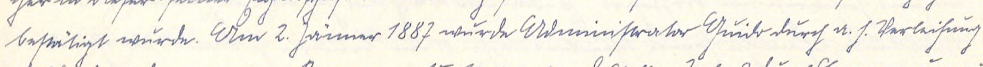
bestätigt wurde. Am 2. Jänner 1887 wurde Administrator Guido durch a. h. Verleihung
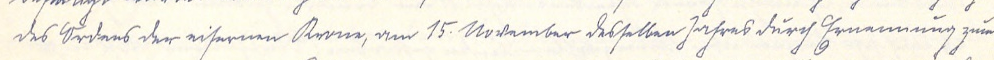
des Ordens der eisernen Krone, am 15. Nobember desselben Jahres durch Ernennung zum
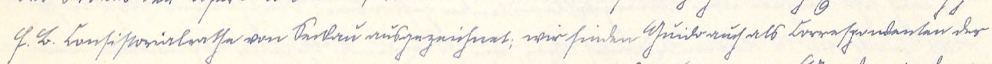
F. B. Consistorialerlass von Seckau ausgezeichnet; wir finden Guido auch als Correspondent der
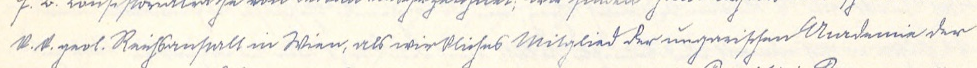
k. k. geol. Reichsanstalt in Wien, als wichtiges Mitglied der ungarischen Academie der
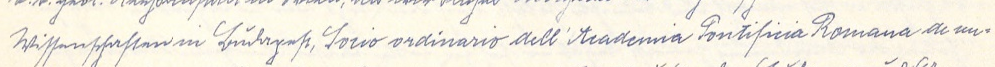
Wissenschaften in Budapest, Socio ordinario dell'Academia Pontificia Romana de nu-
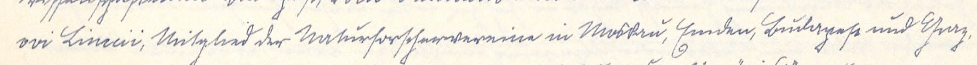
vi Linceii, Miglied der Naturforschervereine in Moskau, Emden, Budapest und Graz,
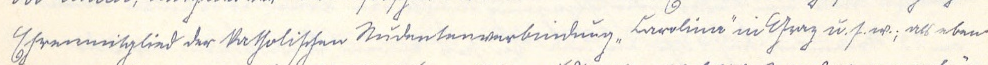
Ehrenmitglied der katholischen Studentenverbindung "Carolina in Graz u. s. w.; als aber
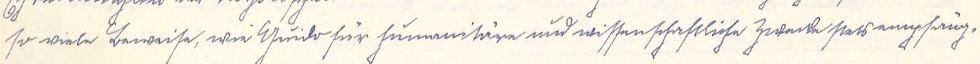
so viele Beweise, wie Guido für humanitäre und wissenschaftliche Zwecke stets empfäng-
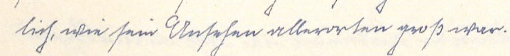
lich, wie sein Ansehen allerorten groß war.
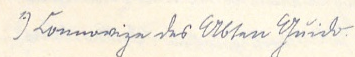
1.) Connovize des Abten Guido.
